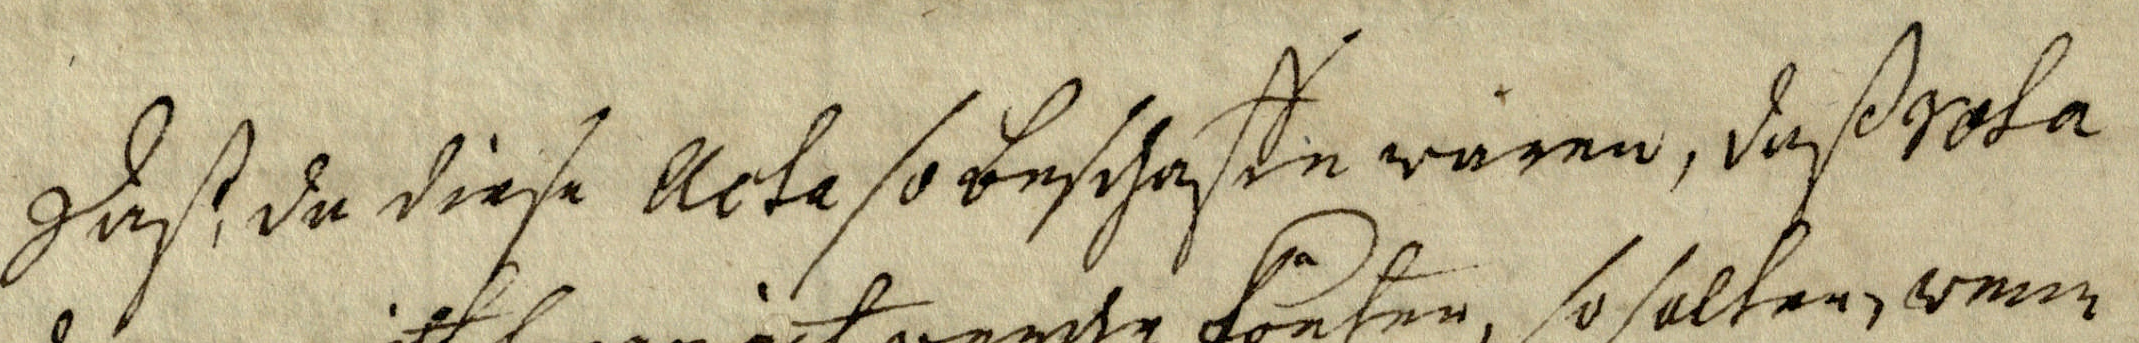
Daß, da diese Acta so beschaffen wären, daß vota
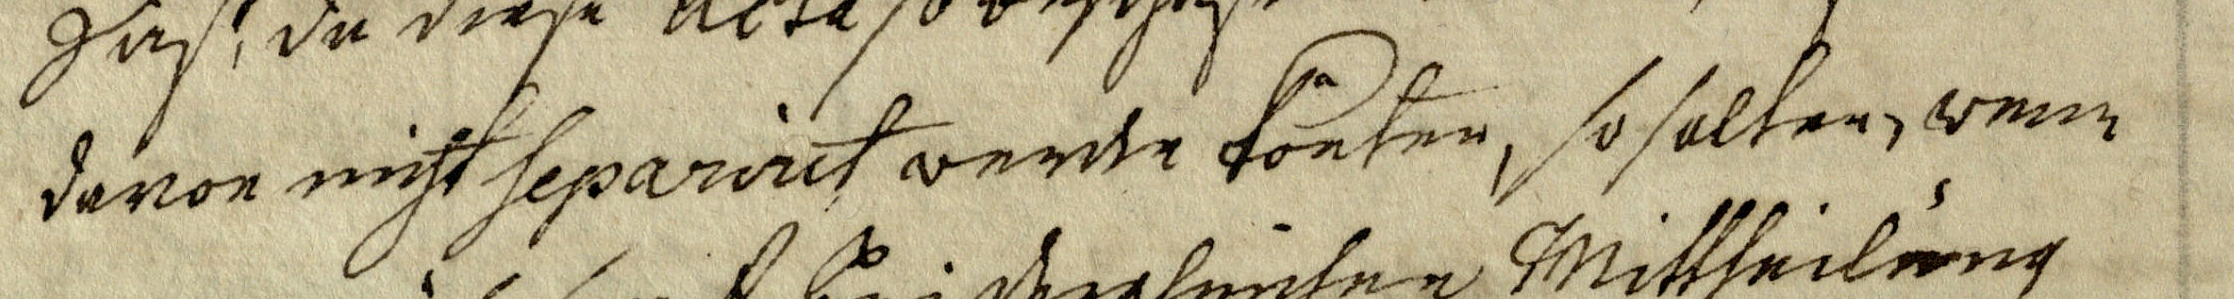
davon nicht separiret werden könten, so solten, wenn
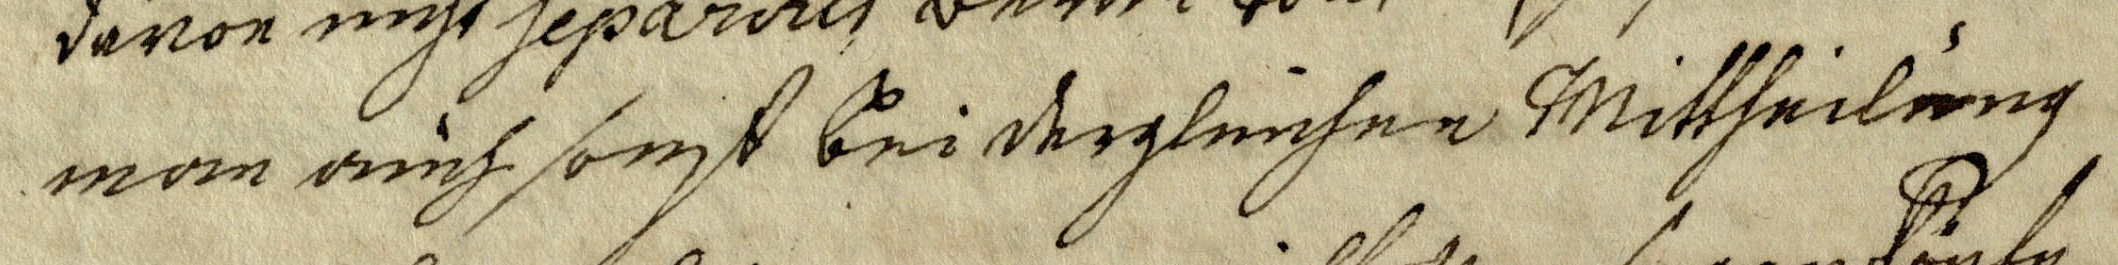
man auch sonst bei dergleichen Mittheilung
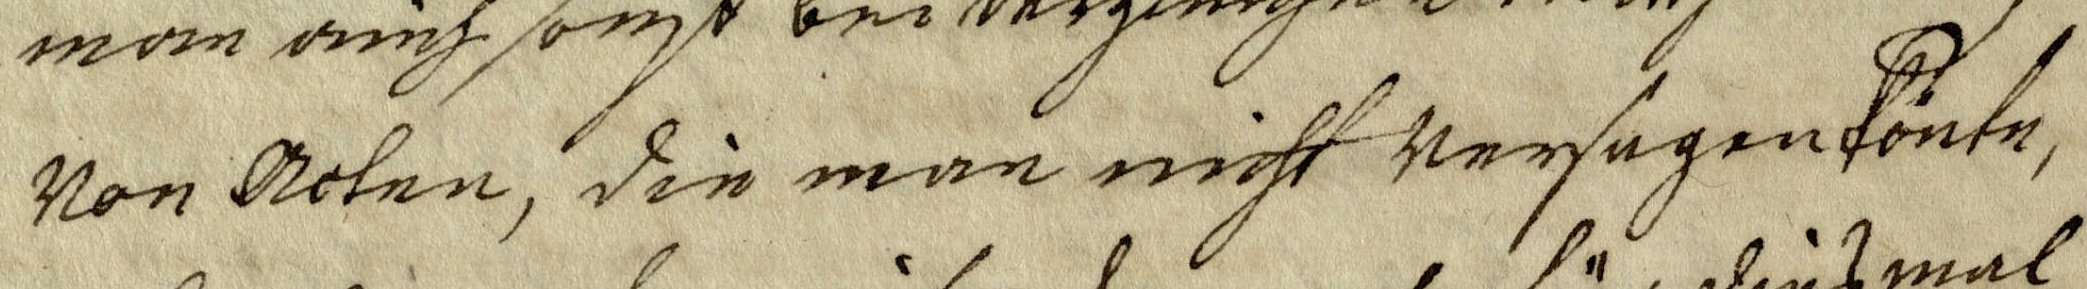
von Acten die man nicht versagen könte,
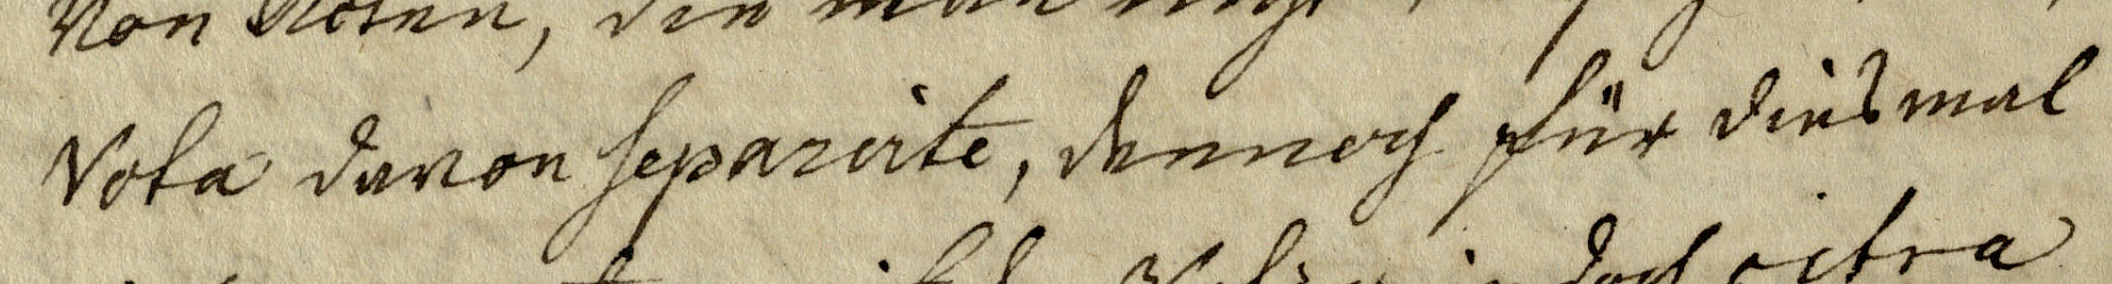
Vota davon separirte, dennoch für diesmal
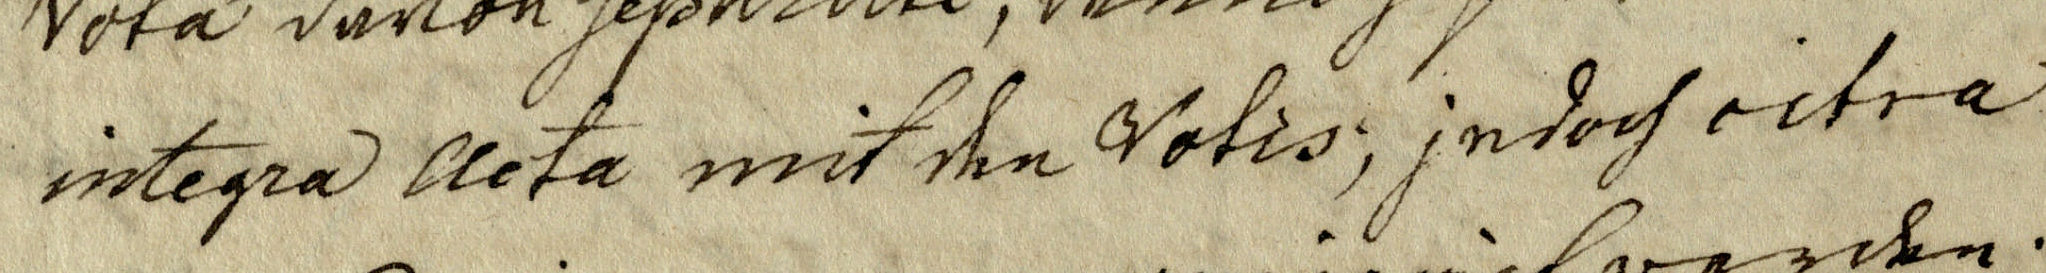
integra Acta mit den Votis, jedoch citra
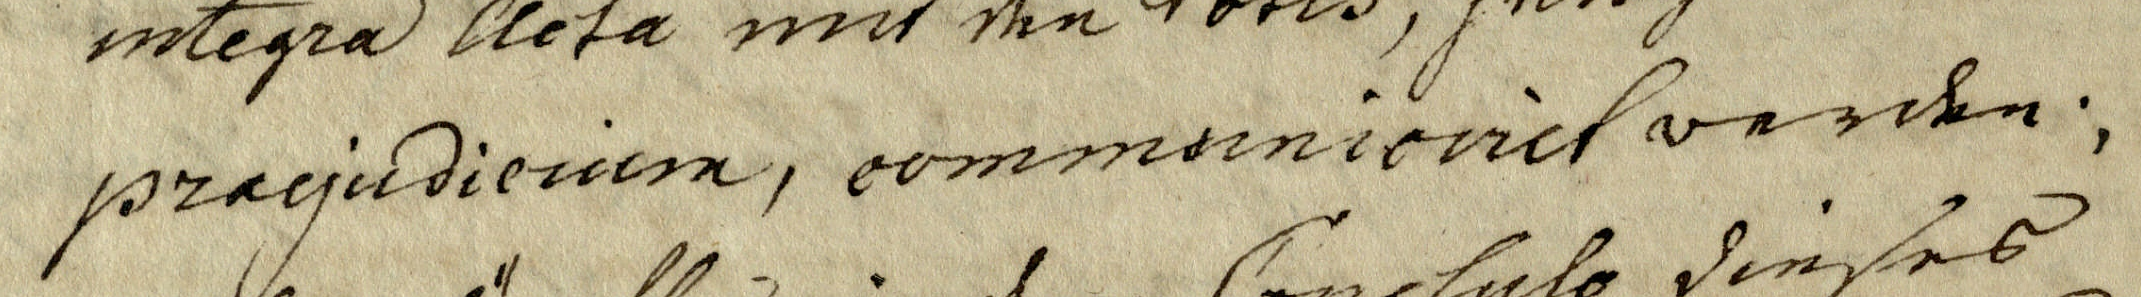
praejudicium, communiciret werden;
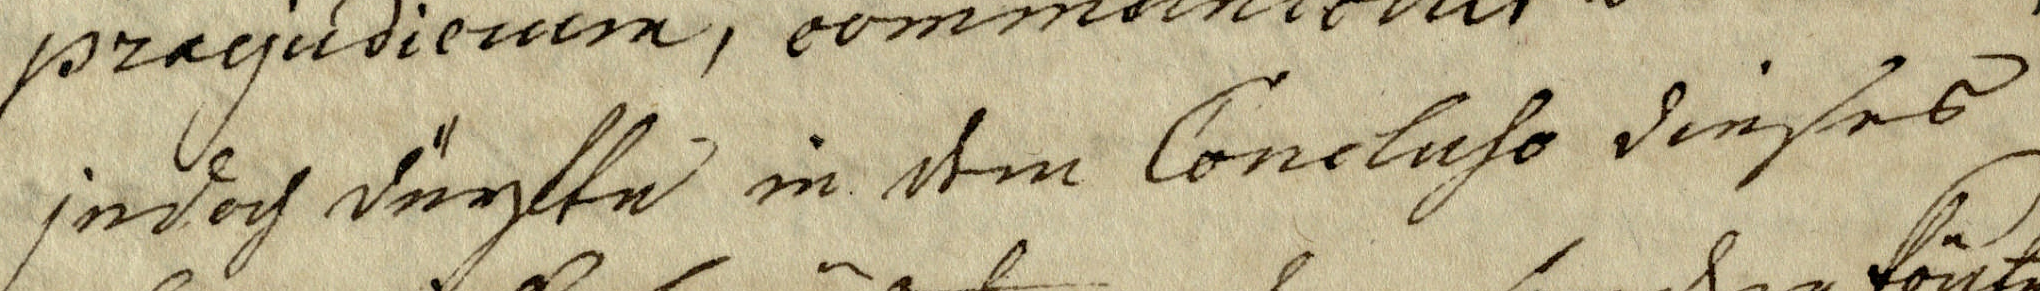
jedoch dürfte in dem Concluso dieses
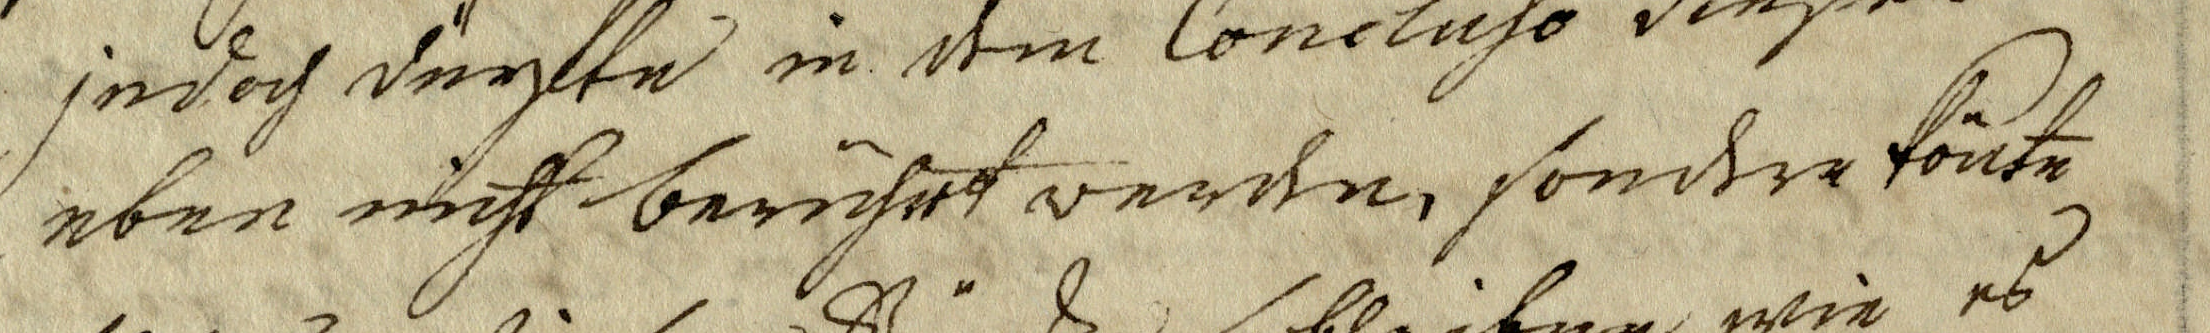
eben nicht berühret werden, sondern könte
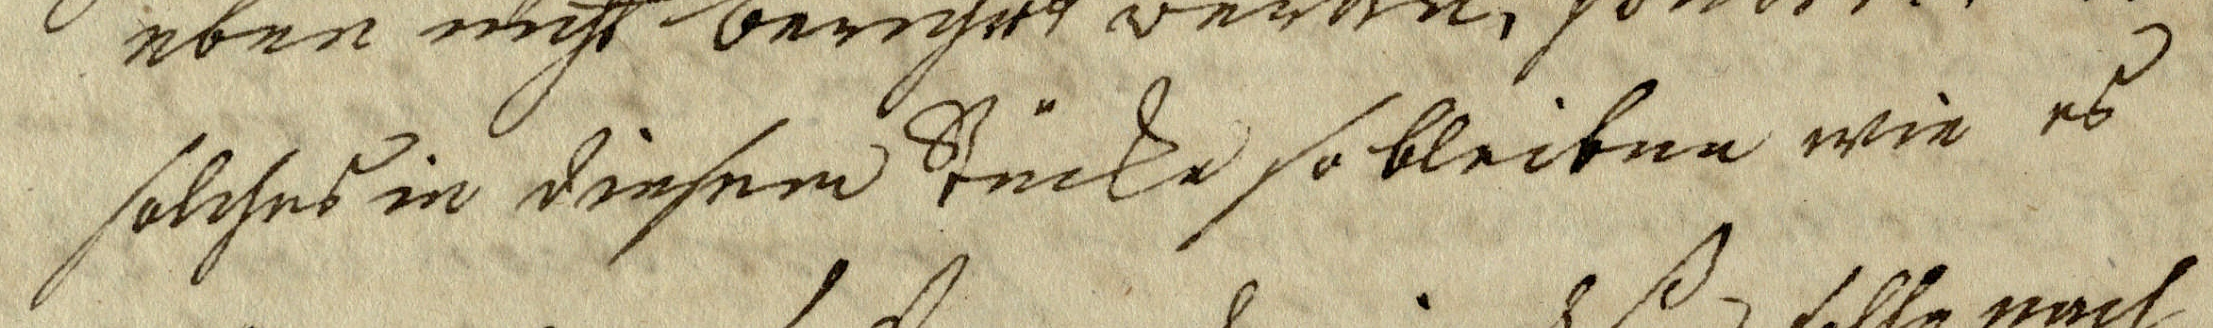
solches in diesem Stücke so bleiben wie es
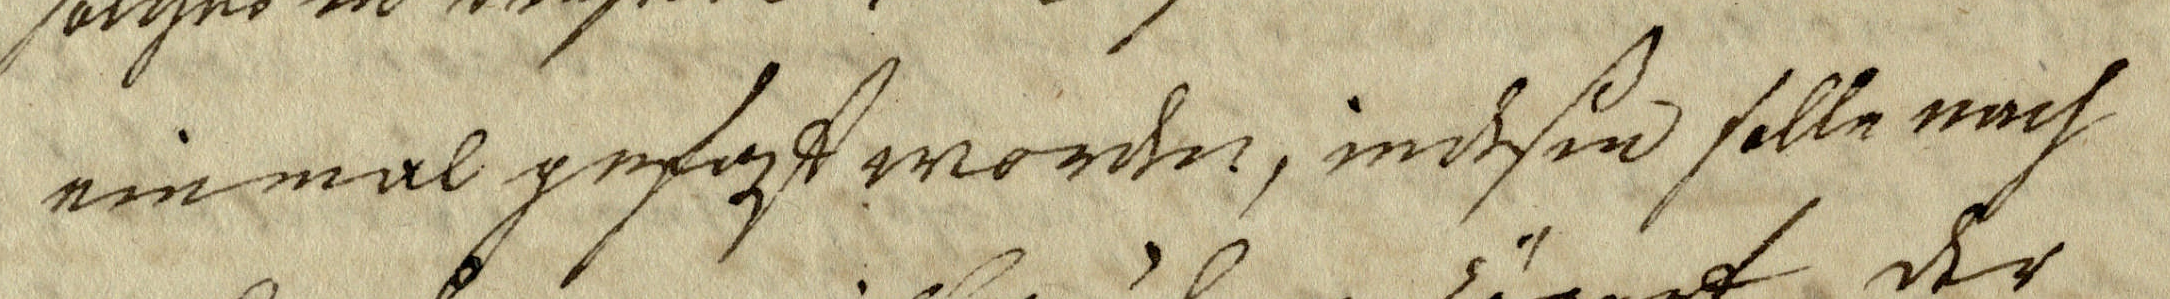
einmal gefast worden, indeßen solle nach
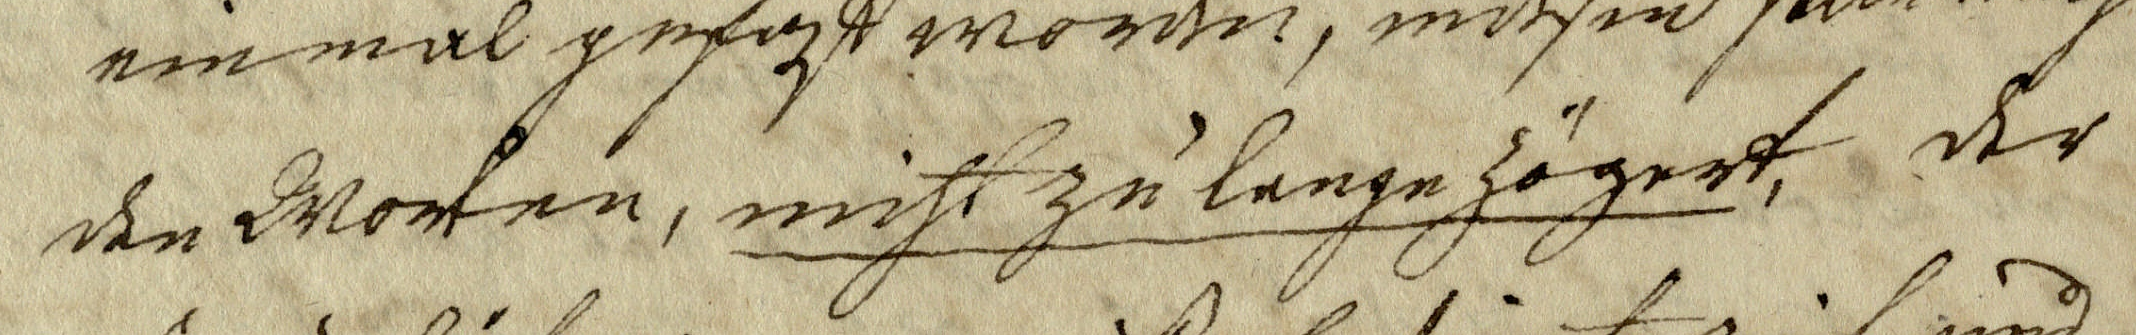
den Worten, nicht zu lange zögert, der
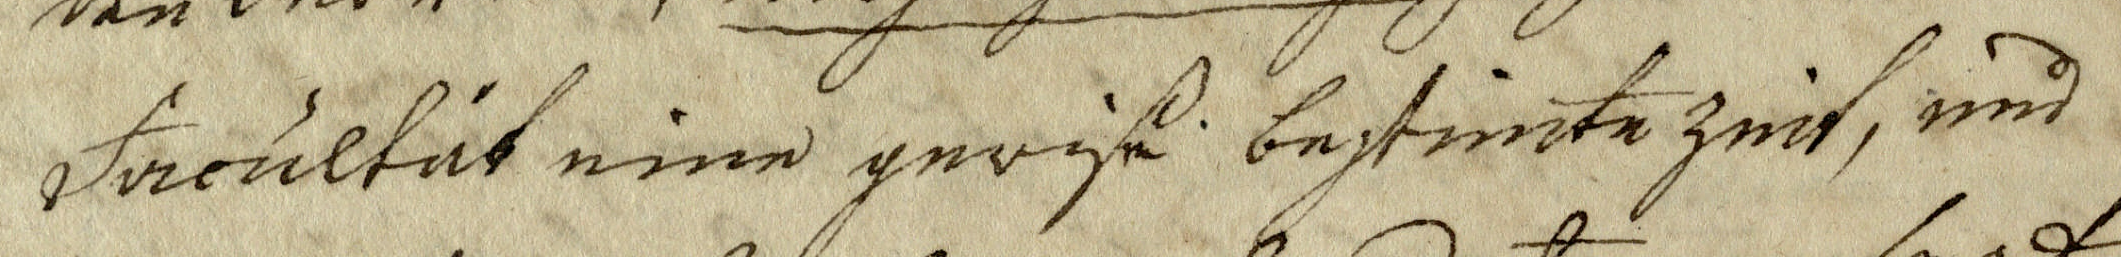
Facultät eine gewiß ebestimte Zeit, und
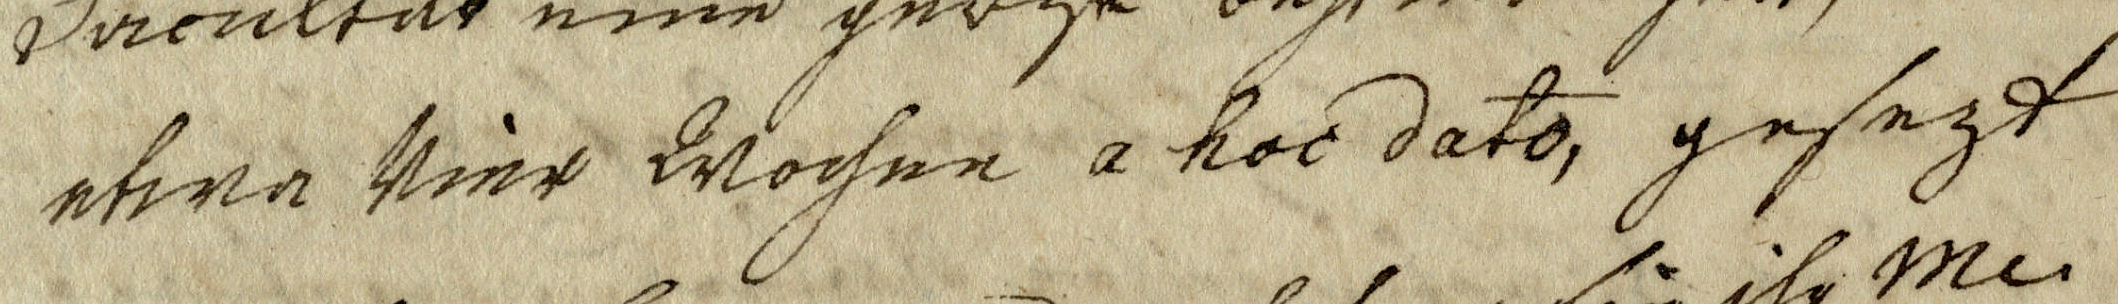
etwa vier Wochen a hoc dato, gesezt
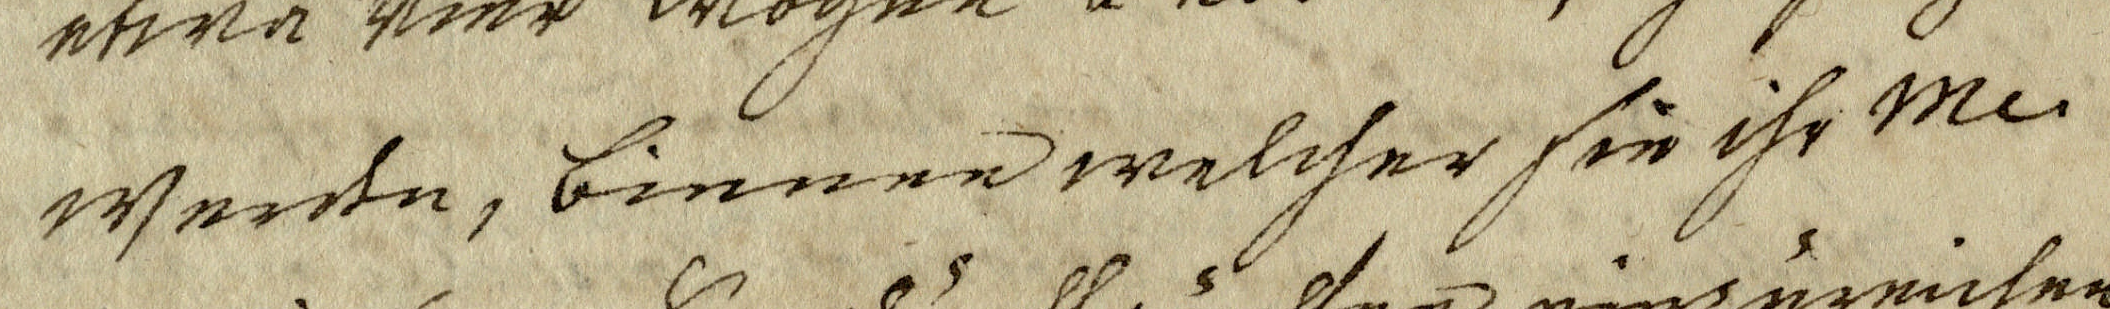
werden, binnen welcher sie ihr Me¬
